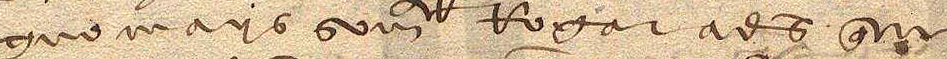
guo mays somte Rogar a ds̄ que me
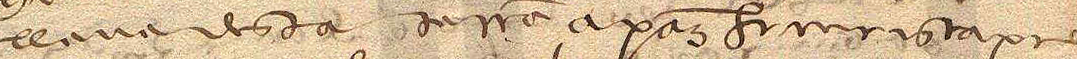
lleue desta terrā a paz he me escape
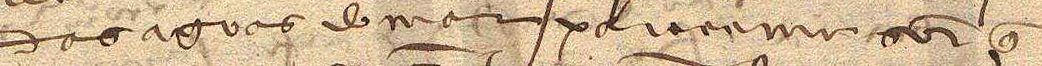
das agoas do mar / pareceme sōr q̄
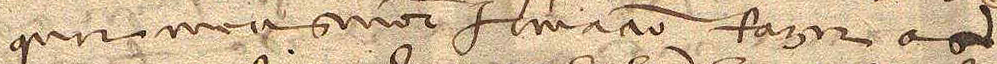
quer meu senōr Jrmaão fazer asē
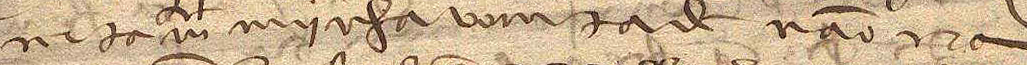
certamte mynha vomtade não era
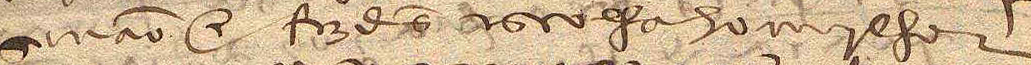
senão ē fez ds̄ escolha ho mjlhor
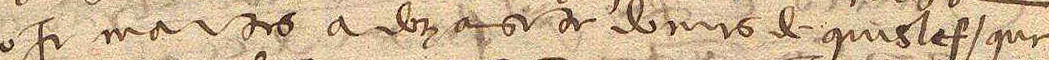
oJe martes a dozasete do mes de quislef / que
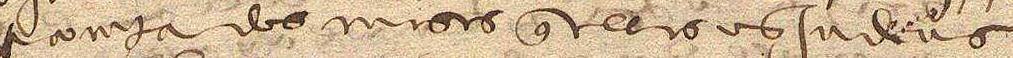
a comta dos meses q̄ elles os Judeus
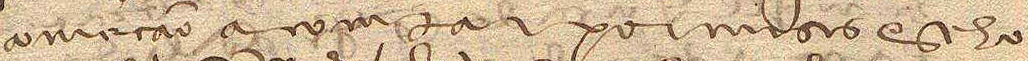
começaõ a comtar por meses e se ho
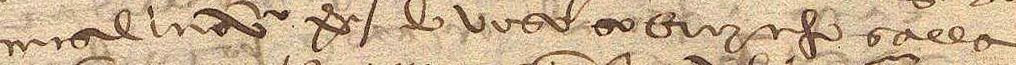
mes de novro / do voso sobrynho salla
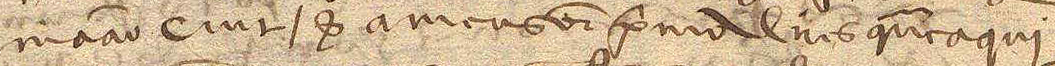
maão cine / a meu sōr p̄imo dires que aquj
